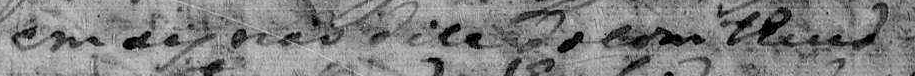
e mais naõ dice do comtheudo
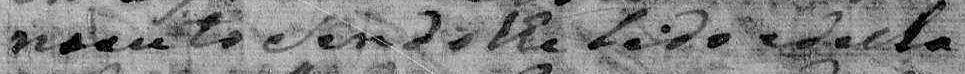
no auto sendolhe Lido e decla
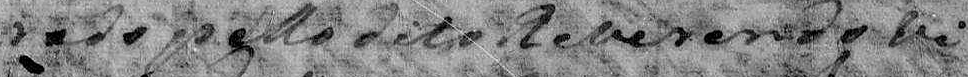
rado pello dito Reverendo vi
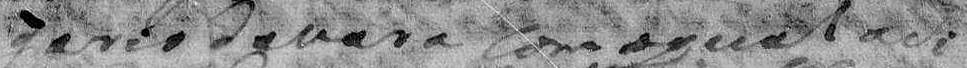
gario da vara com o qual asi
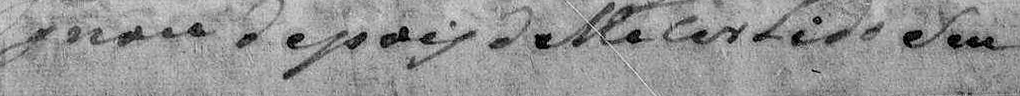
gnou depois de lhe cer Lido seu
